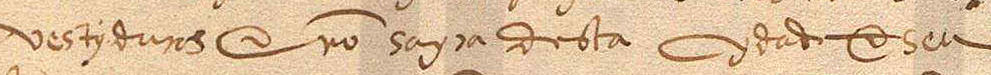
vestyduras e n̄o sayra desta Cydade e seu
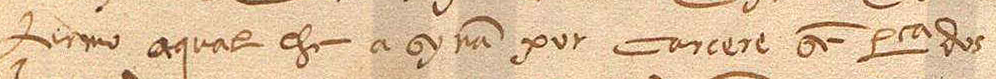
termo a quaL lhe asynā por Carcere s̄e Lça dos
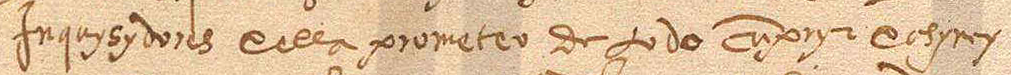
Jnquysydores e ella prometeo de todo c̄upryr e asyney
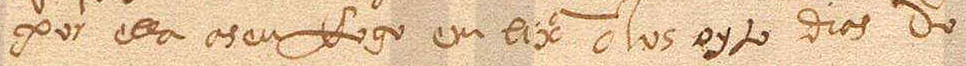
por ella a seu Rogo em lixa Aos oyto dias do
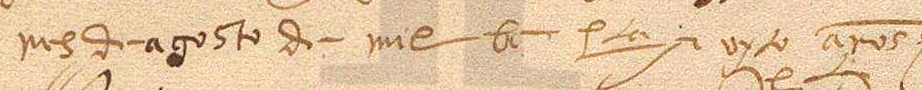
mes de agosto de mil bc Lta e oyto ānos
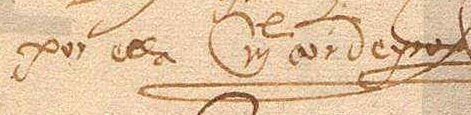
por ella mel cordeyro
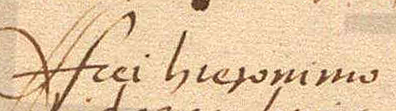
frei hieronimo
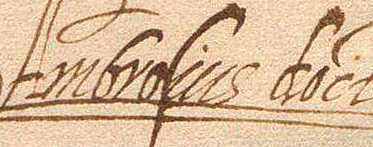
Ambrosius doct
